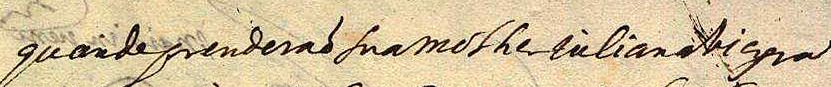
quando prenderaõ sua molher iuliana vieyra
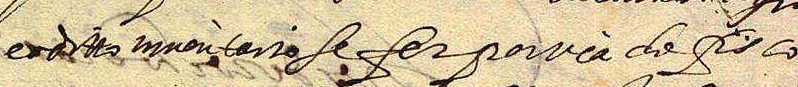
e o ditto inuentario se fez por via do fisco
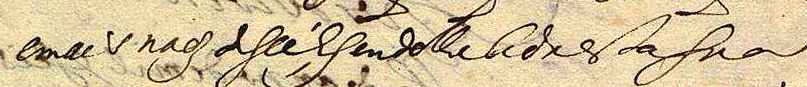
e maes naõ disse, E sendolhe lida esta sua
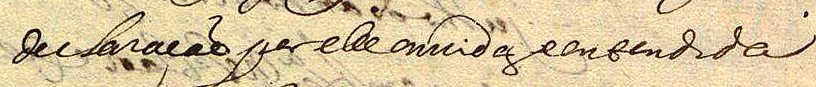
declaraçaõ por elle ouuida, e entendida
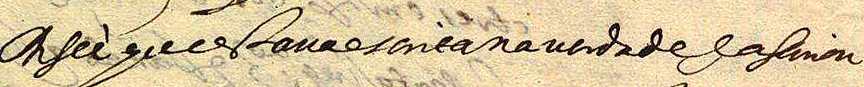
Disse que estaua escrita na uerdade, e assinou
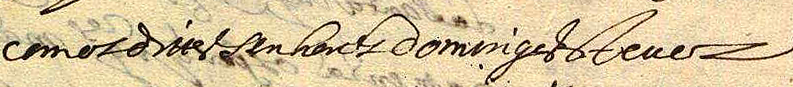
com os dittos senhores domingos esteuez
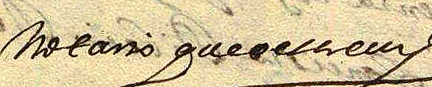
notario que o escreuj
